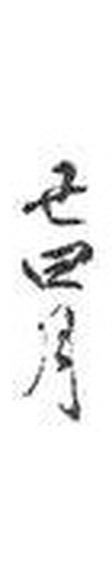丑四月
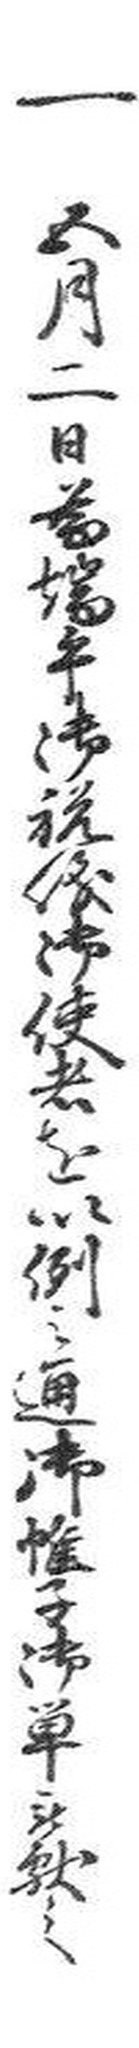一五月二日為端午御祝儀御使者を以例之通御帷子御単被献之
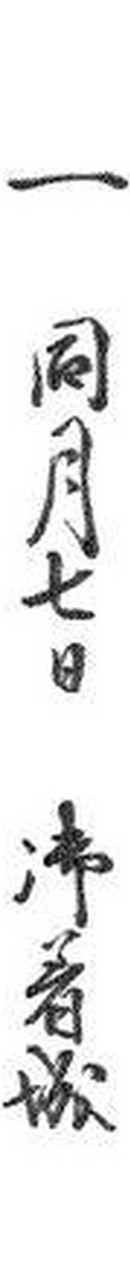一同月七日御着城
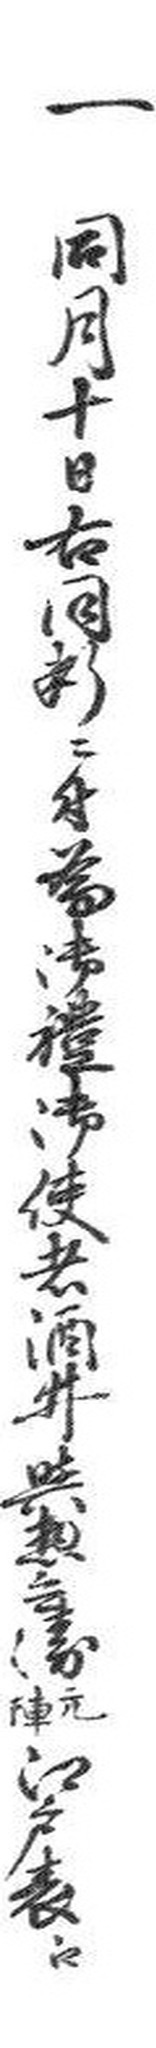一同月十日右同断ニ付為御礼御使者酒井與惣兵衛元陣江戸表江
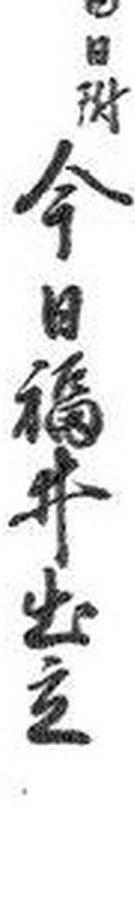今日福井出立
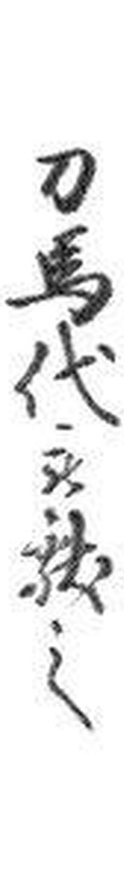刀馬代被献之
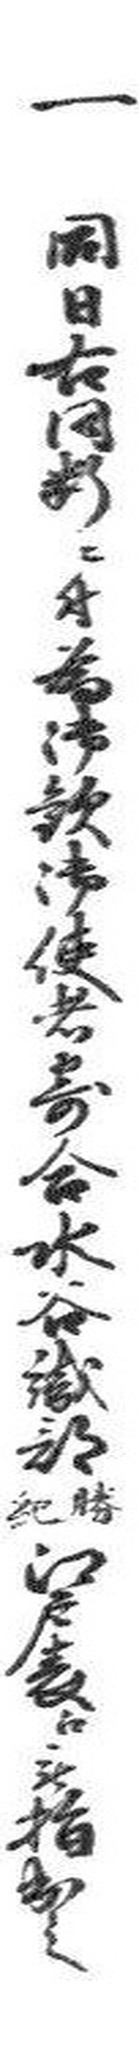一同日右同断ニ付為御歓御使者寄合水谷織部勝紀江戸表江被指出之
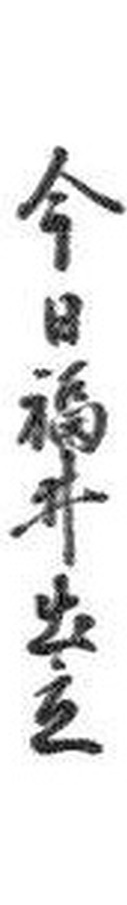今日福井出立
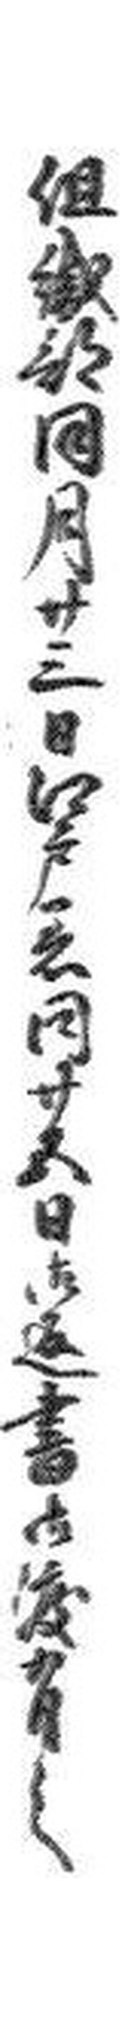但織部同月廿三日江戸着同廿五日御返書御渡有之
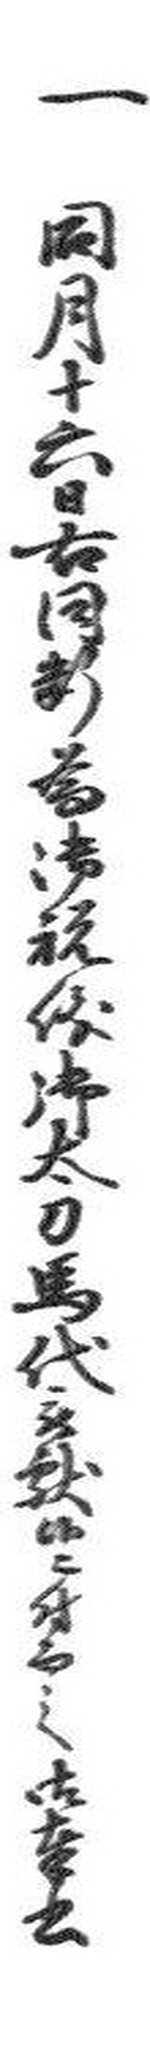一同月十六日右同断為御祝儀御太刀馬代被献候ニ付而之御奉公
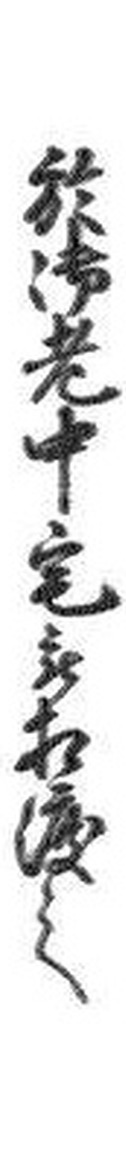於御老中宅被相渡之
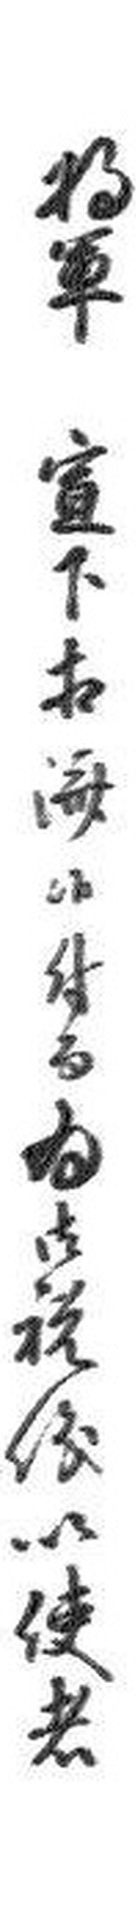将軍宣下相済候付而為御祝儀以使者
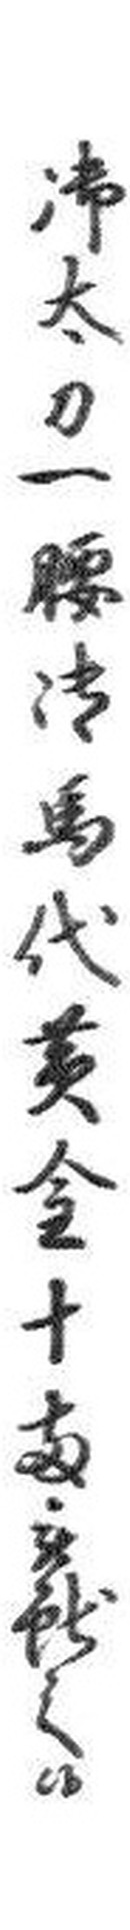御太刀一腰御馬代黄金十両被之候
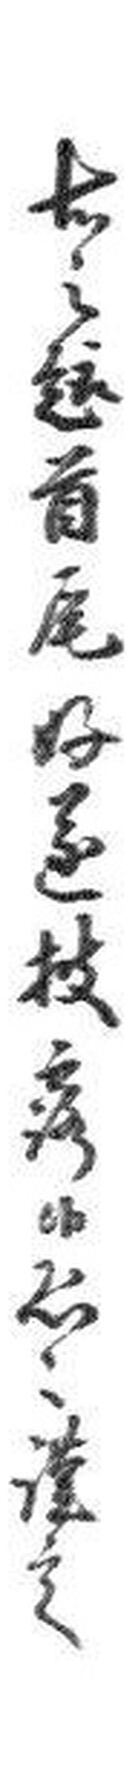右之趣首尾好遂披露候恐々謹言
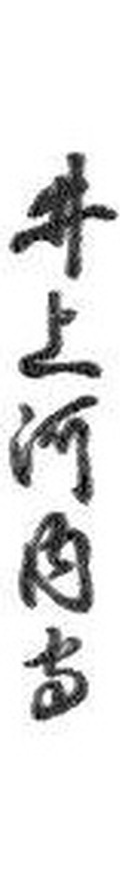井上河内守
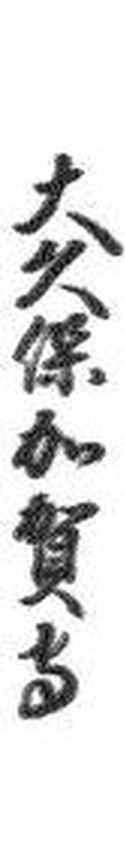大久保加賀守
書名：家譜 二十五 吉品公 従宝永六年到同七年
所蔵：福井県文書館 Fukui Prefectural Archives
